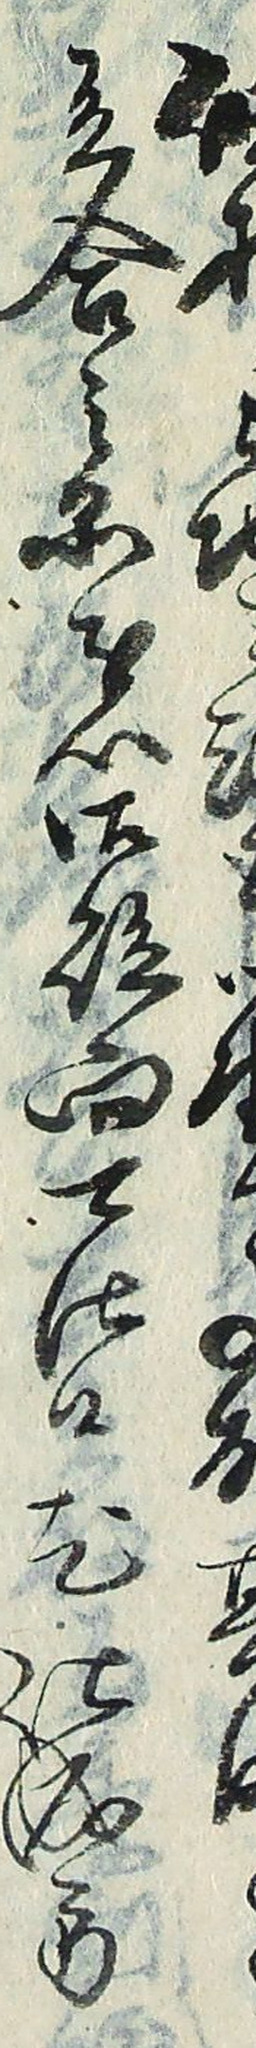有合之品を以御賄向可仕候尤仕成方
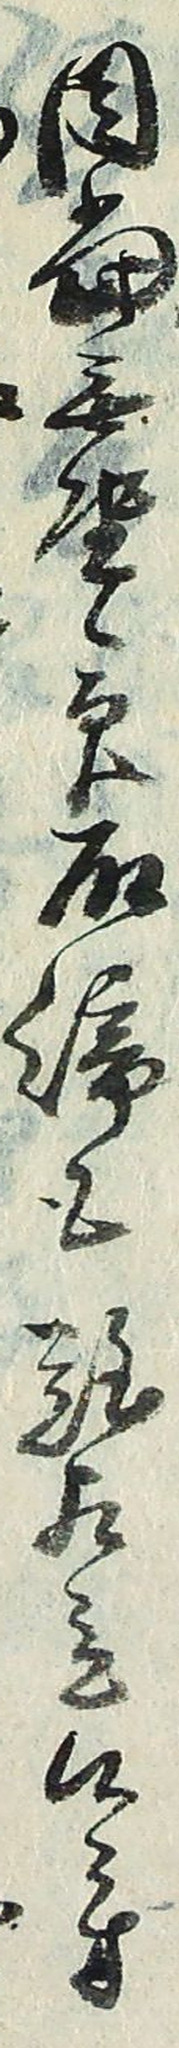目当無御坐候而は取締も難相立候に付
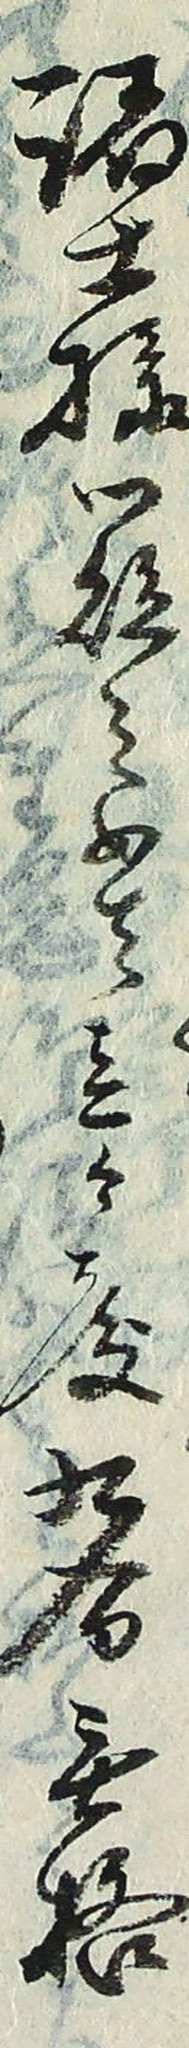諸士様御賄之義は壱ケ度九分無格
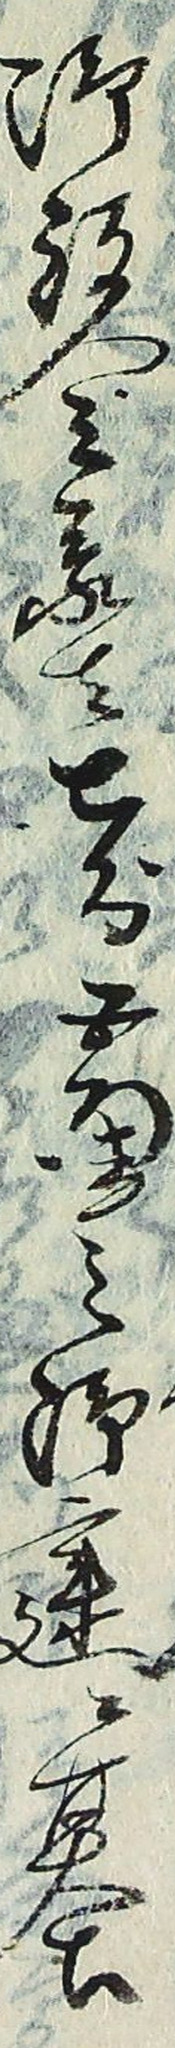御役人之義は七分五厘之御建に基
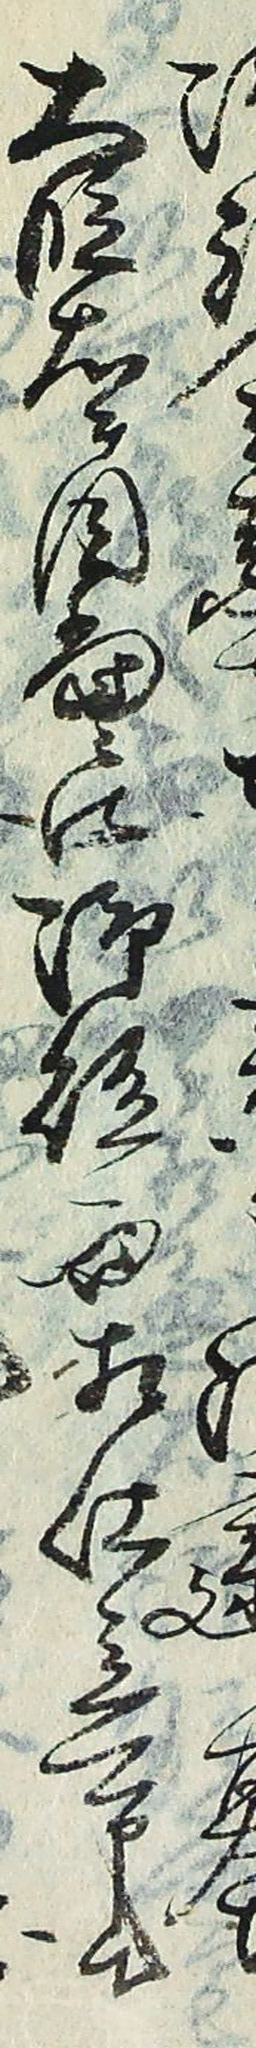大段右を目当に仕御役向相仕立可申候
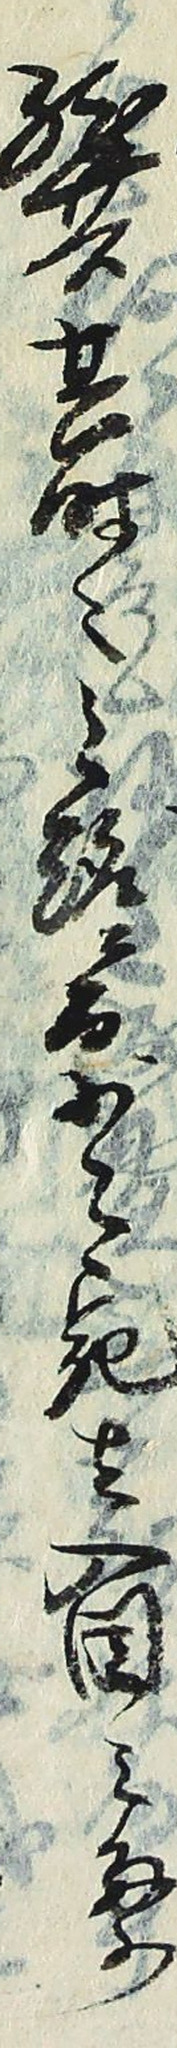然共其時々之趣に而少々宛は入目之多少
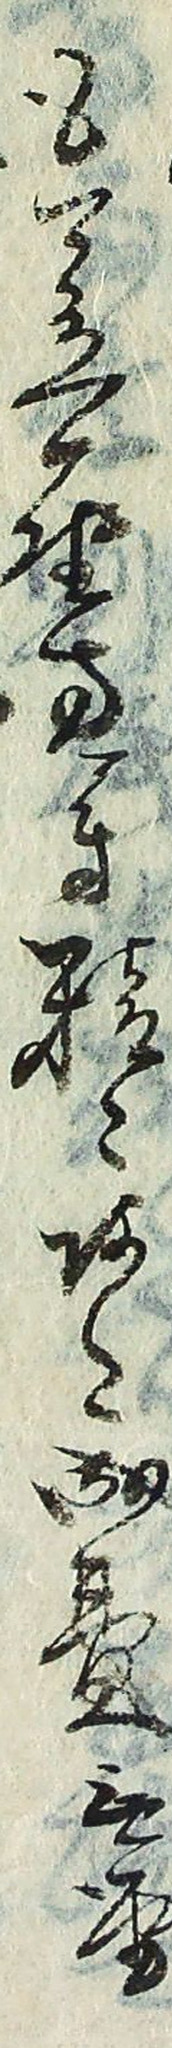も可有御坐方に付精々あた成費無御坐
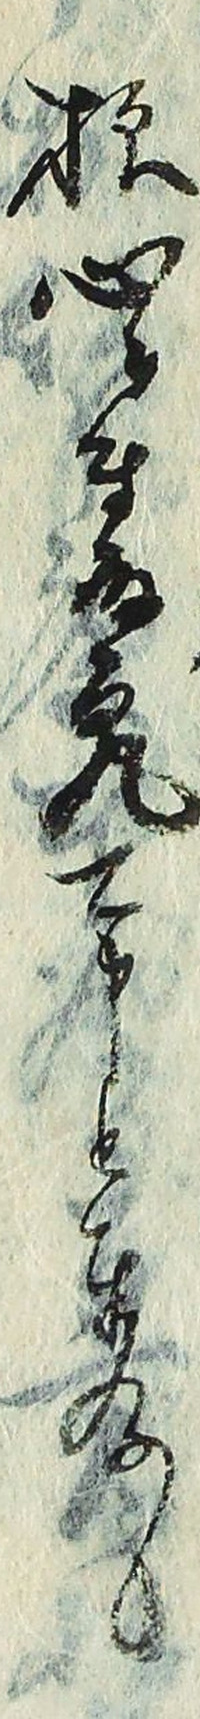様心を付取究可申と奉存候
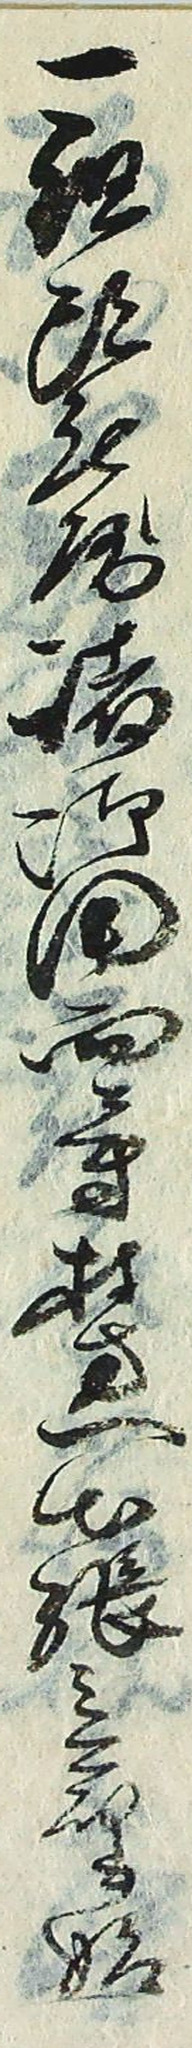一組頭庄屋諸御用向に付村方へ出張之節を始
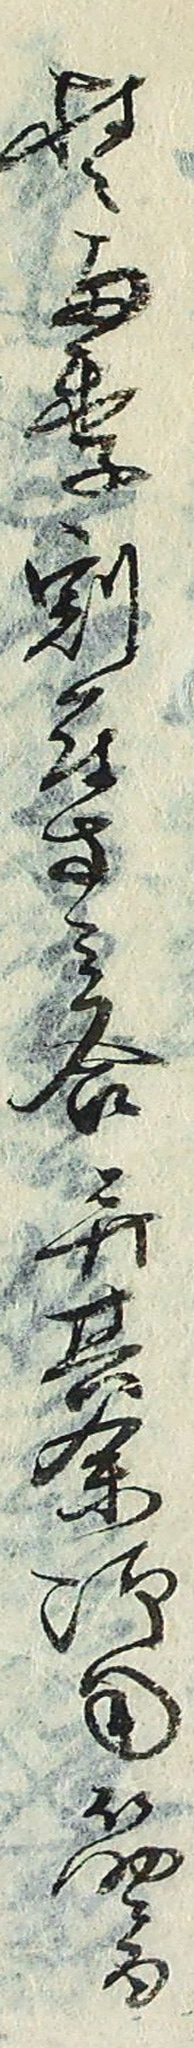村々両季割符方立合幷其余御用筋に而
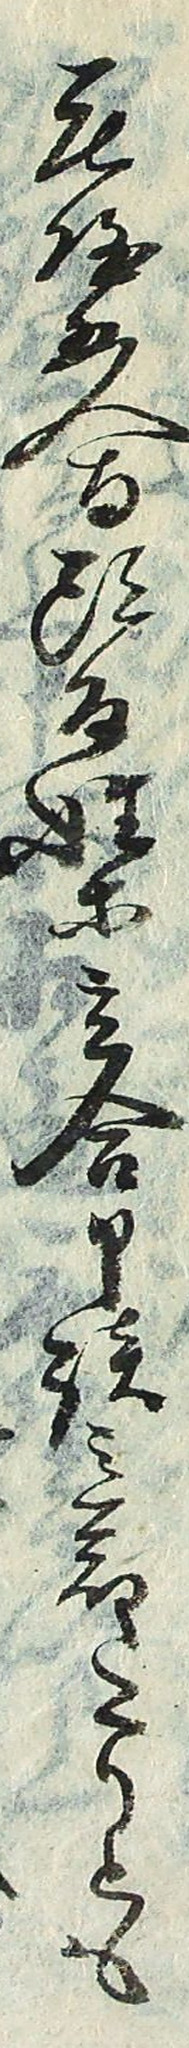庄屋五人与頭百姓等立合申談之節たりとも
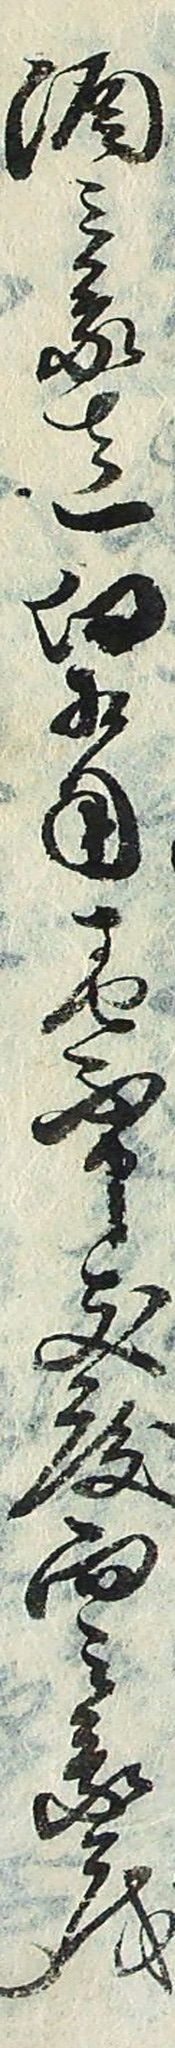酒之義は一向相用させ不申支度向之義も
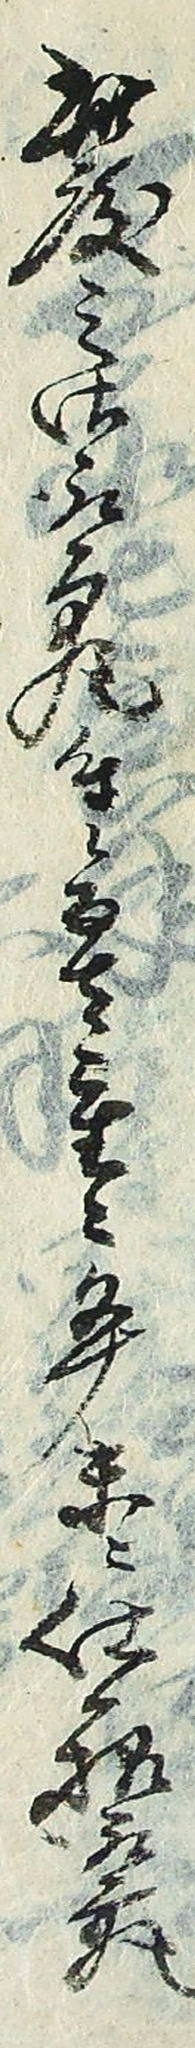此度之御取究付候而は重々麁末に仕候様取究
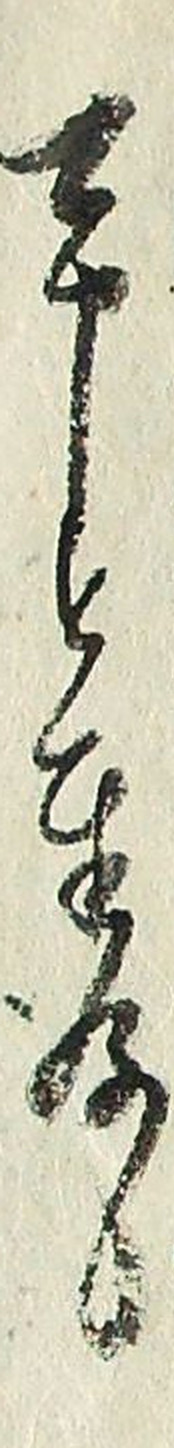可申と奉存候

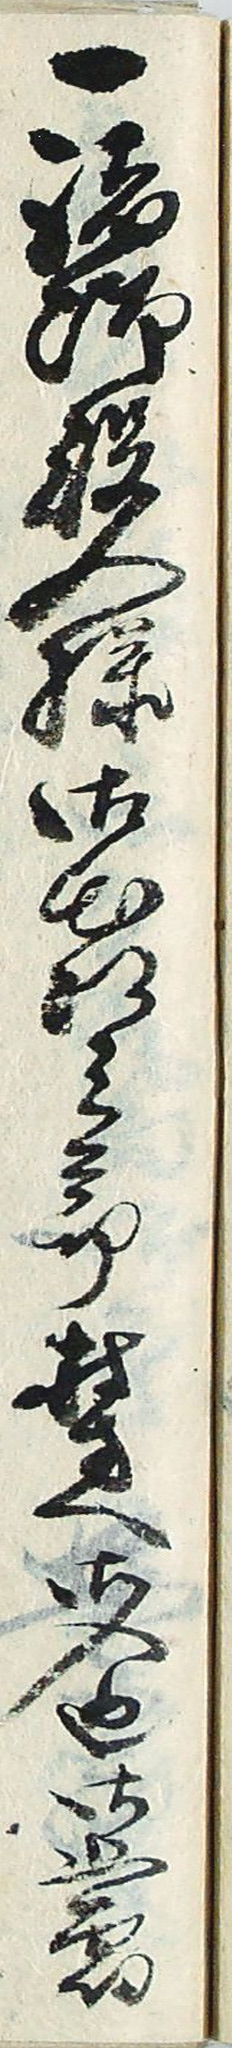一諸御役人様御出郷之節村方へ御入込御止宿
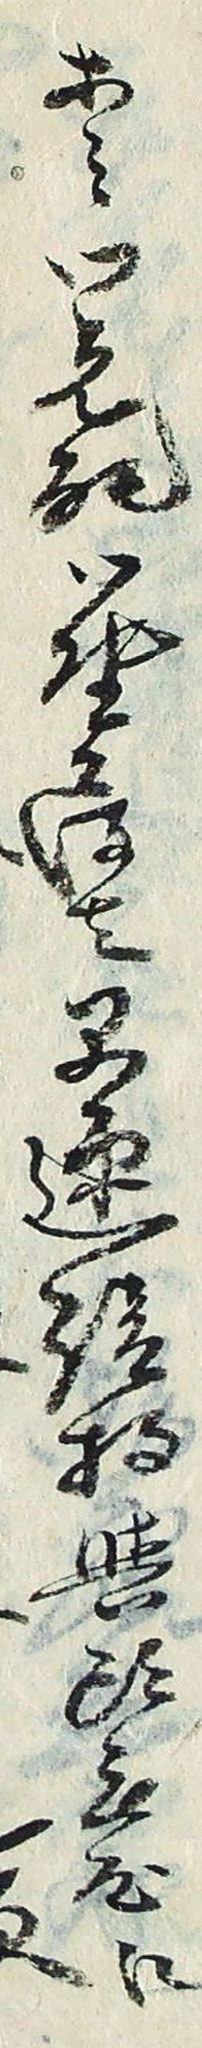等之御先配御坐候得者早速請持与頭庄屋江
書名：諸御用御□受書控
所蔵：鳴門教育大学 Naruto University of Education
